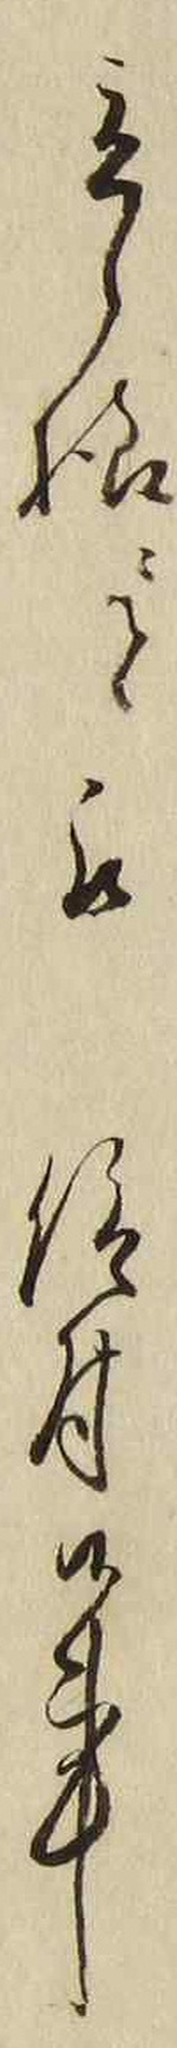立候様ニと被仰付候事

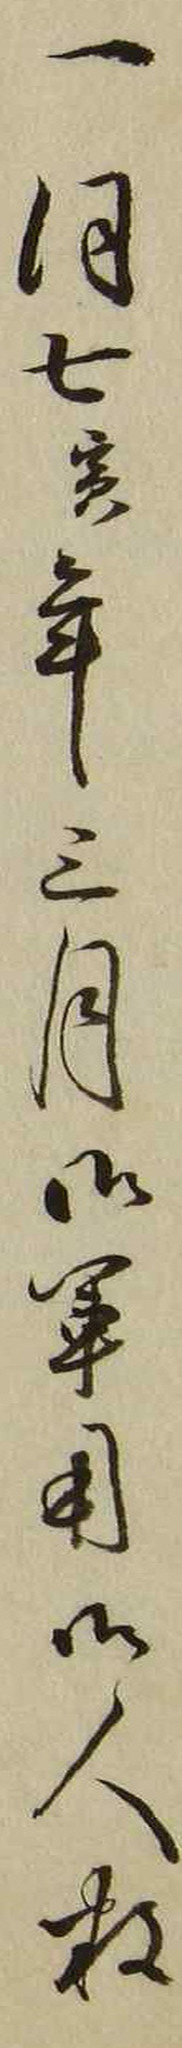一同七寅年三月御軍用御人数
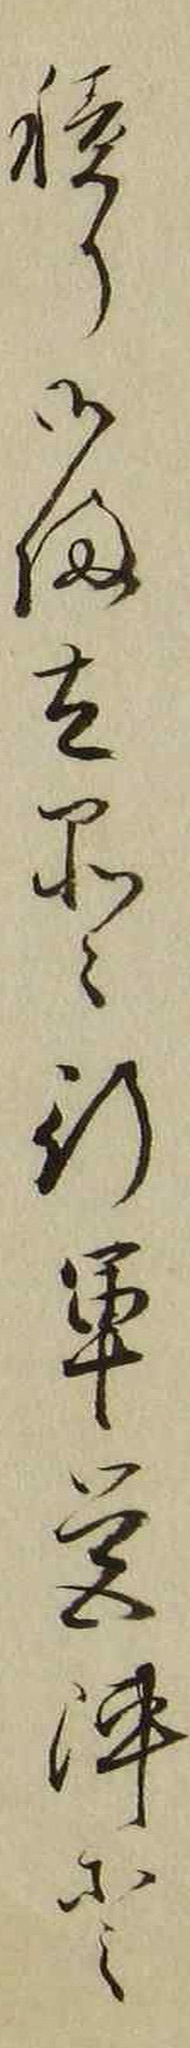積り御備立品々行軍営陣等之
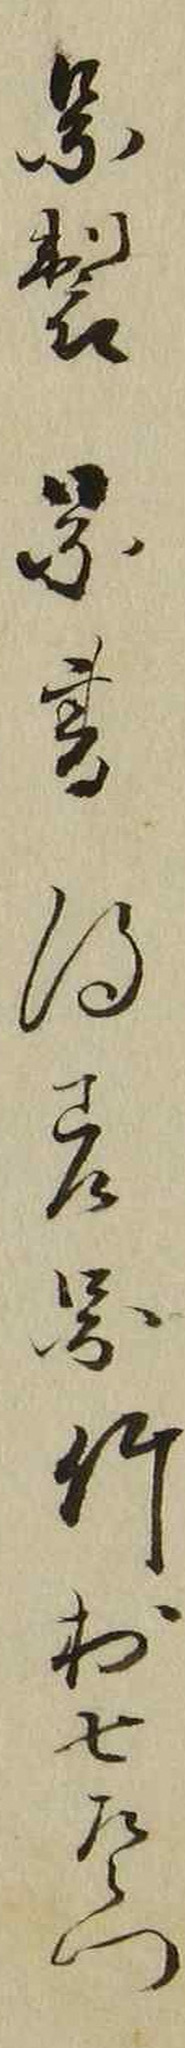図製図書得差図竹村七左衛門
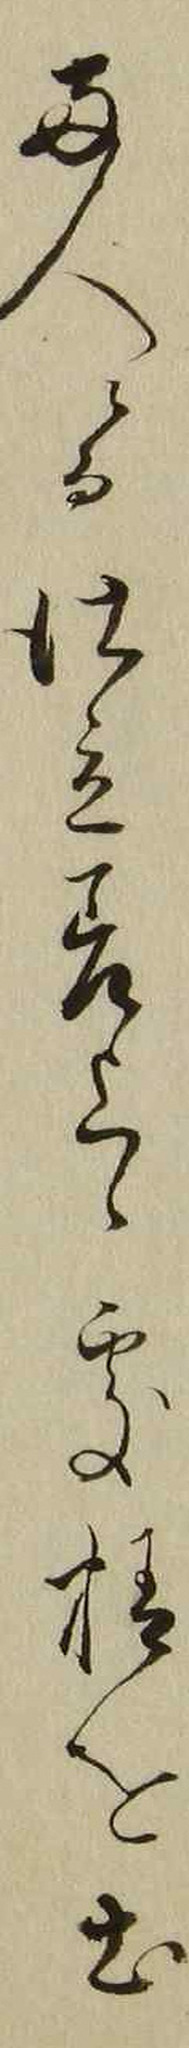両人ニ而仕立差上候処精を出
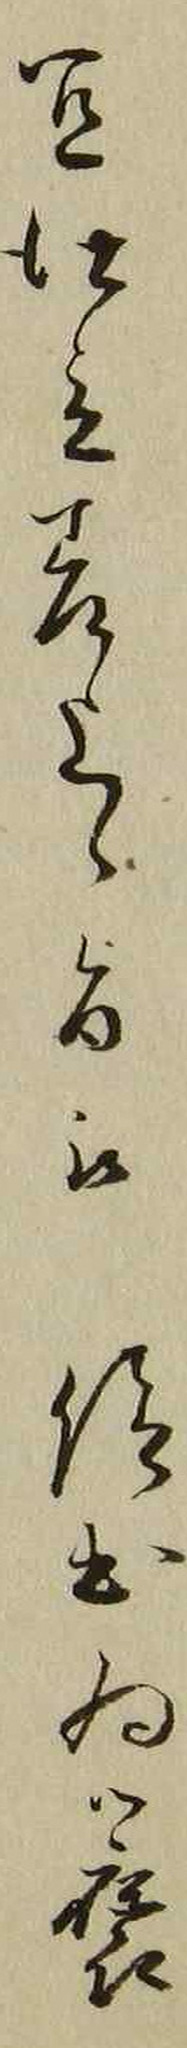宜仕立差上候旨被仰出為御褒
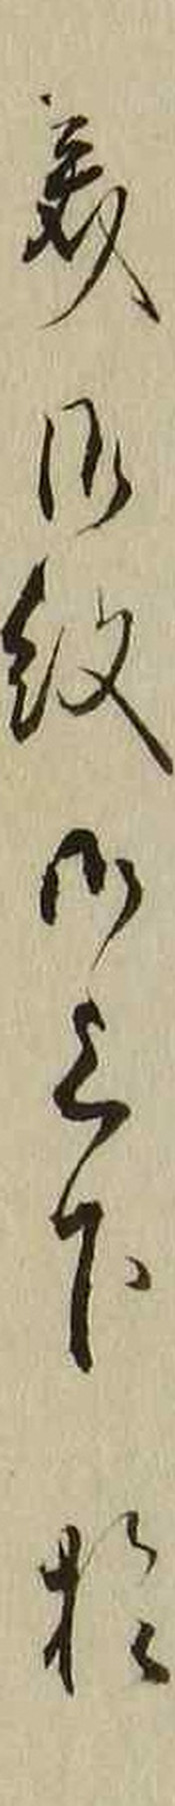美御紋御上下於
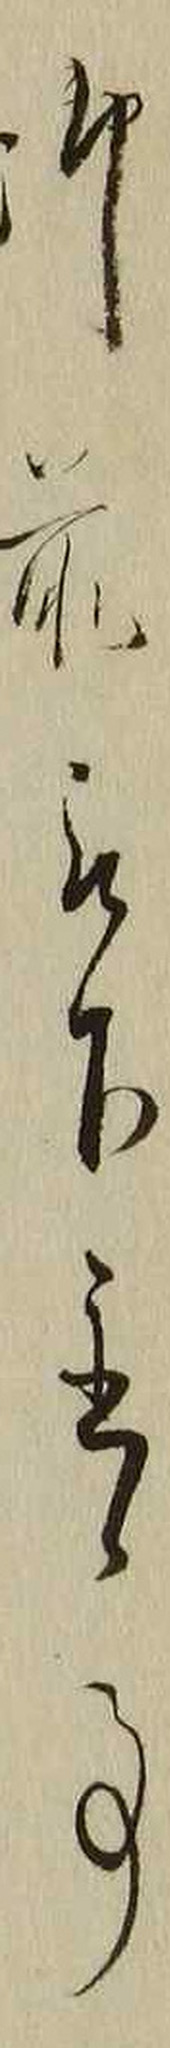御前被下置候事
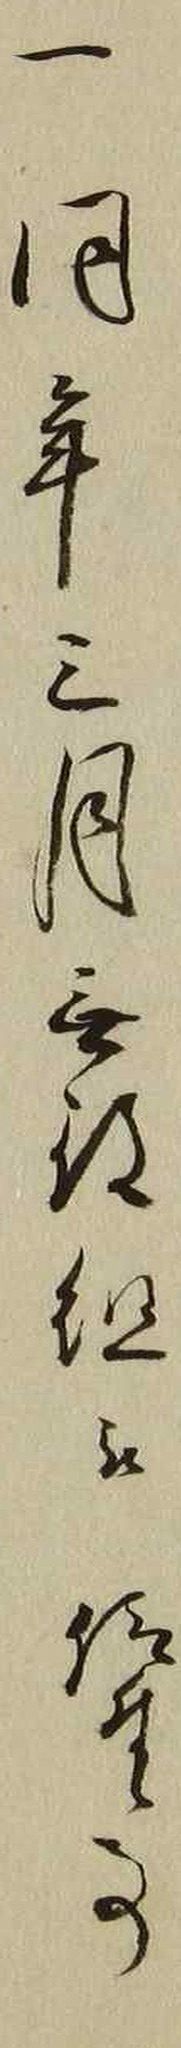一同年三月無役組被仰付候事
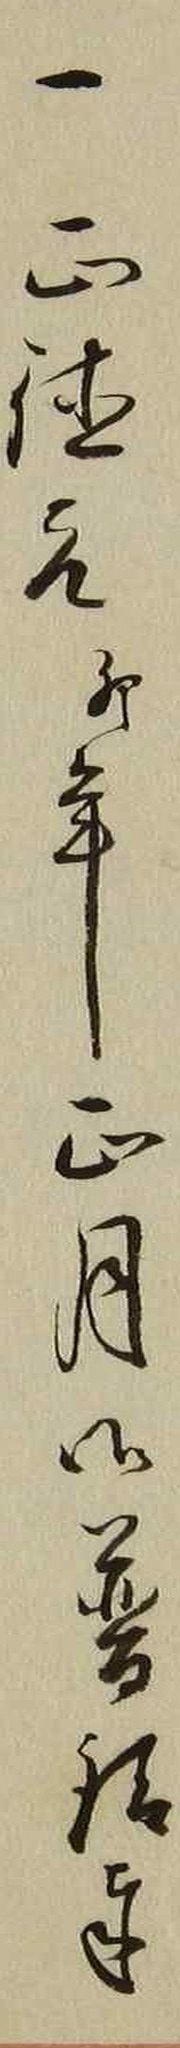一正徳元卯年正月御普請奉
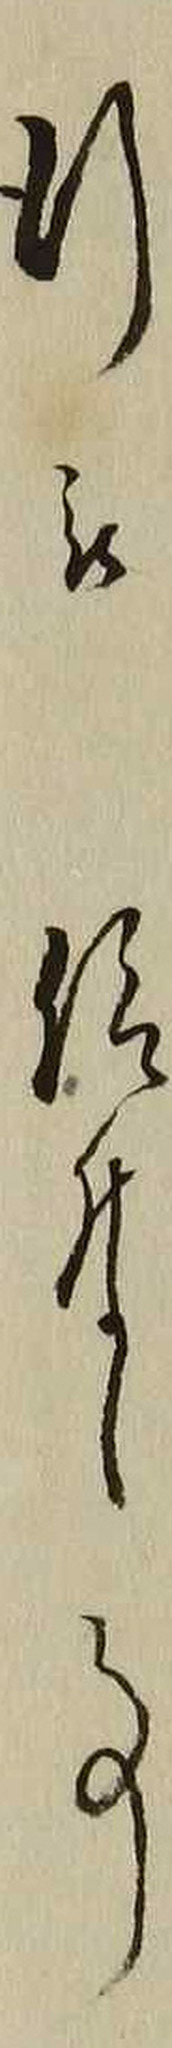行被仰付候事
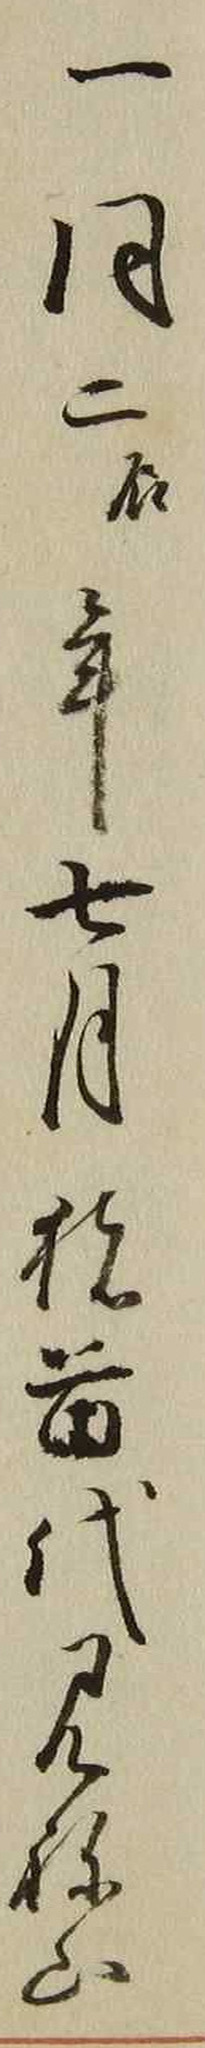一同二辰年七月猪苗代見祢山
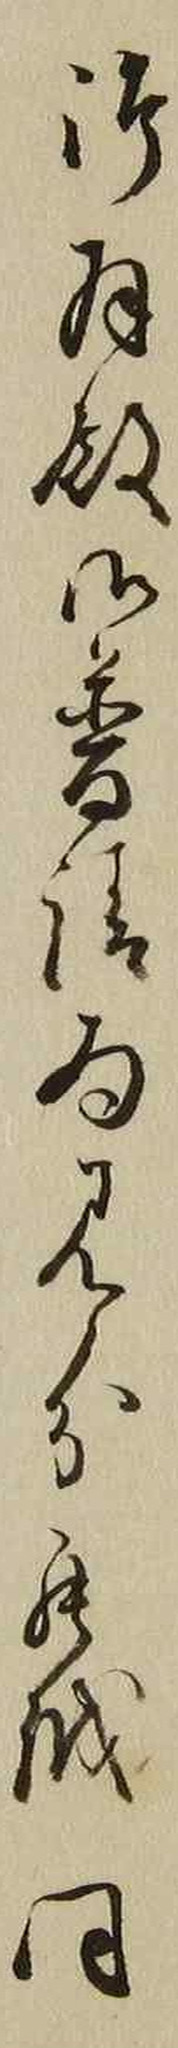御拝殿御普請為見分罷越同
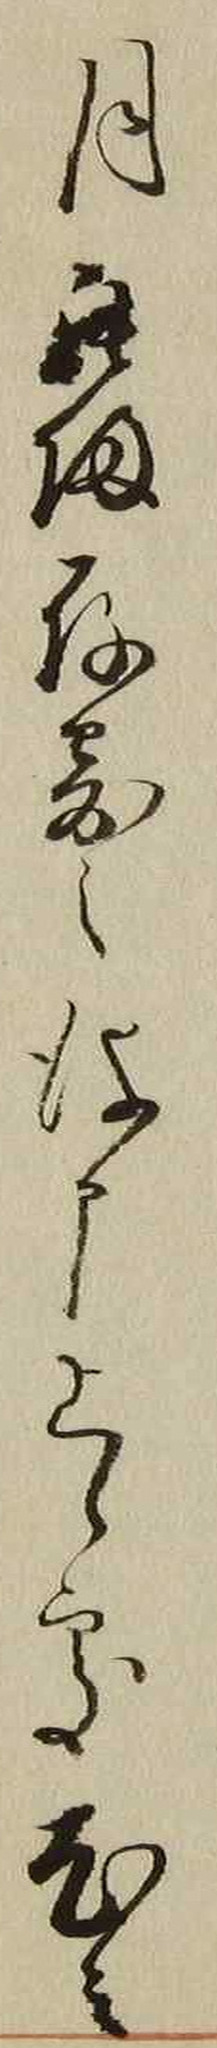月罷帰存寄之儀申上候処尤之
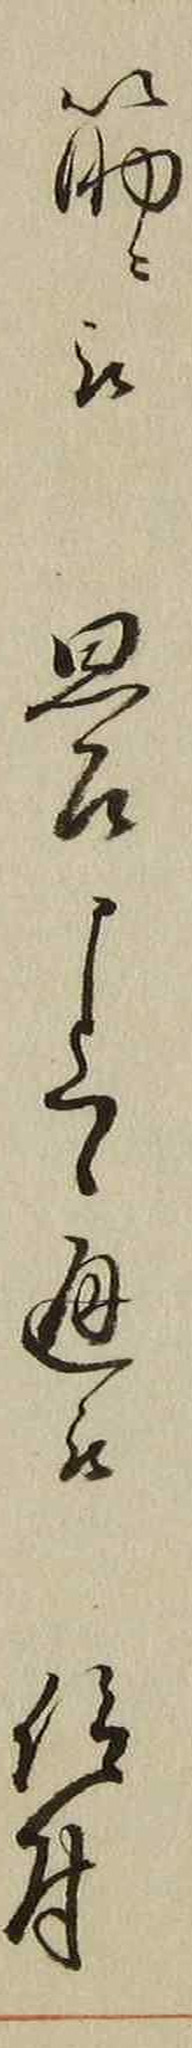筋ニ被思召申上候通被仰付
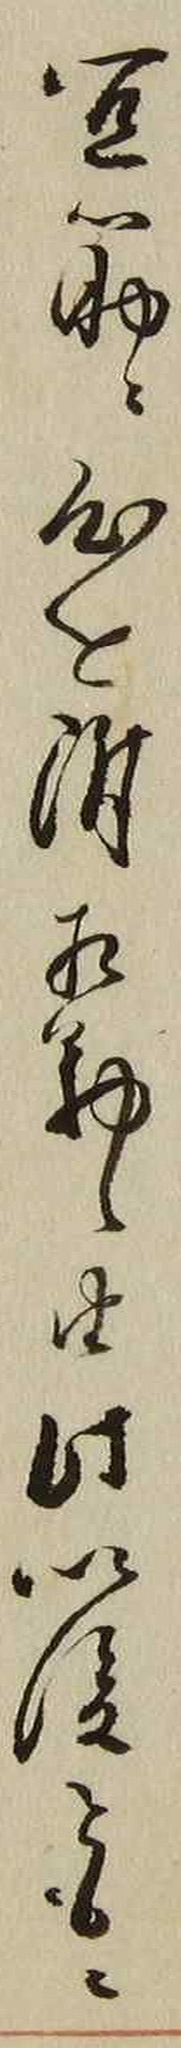宜筋ニ心を附相筋候由此以後ともニ
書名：諸士系譜　巻之1　い之部1
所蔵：会津若松市立会津図書館
